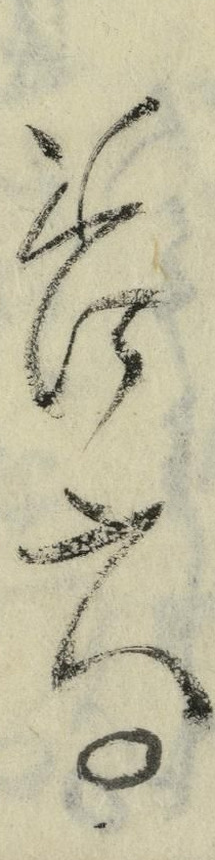嘉右衛門
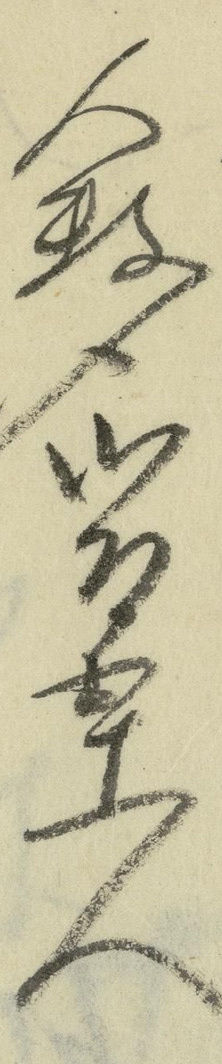人数〆弐百五十一人

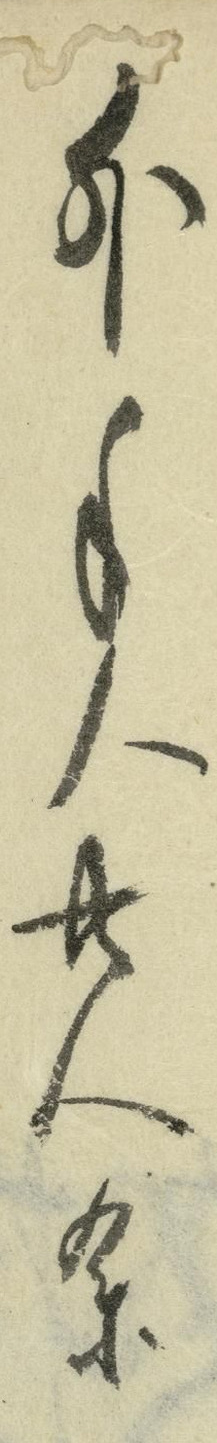外手人廿人余
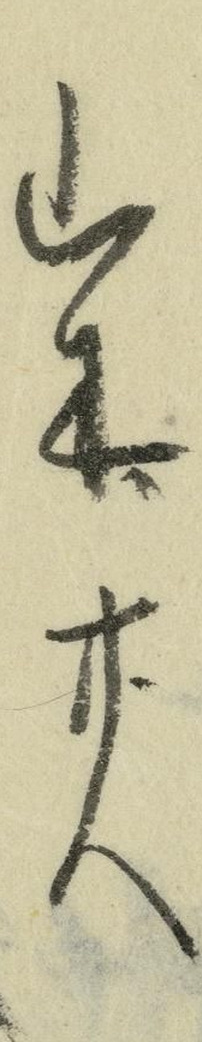山木廿人
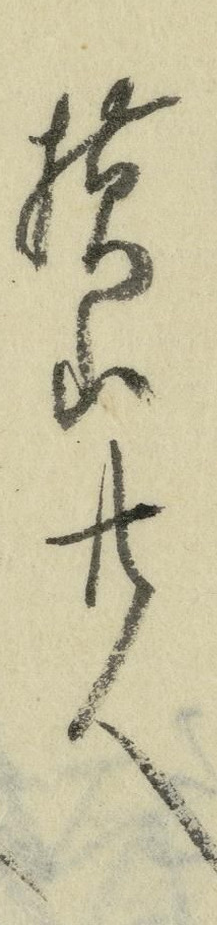横山廿人
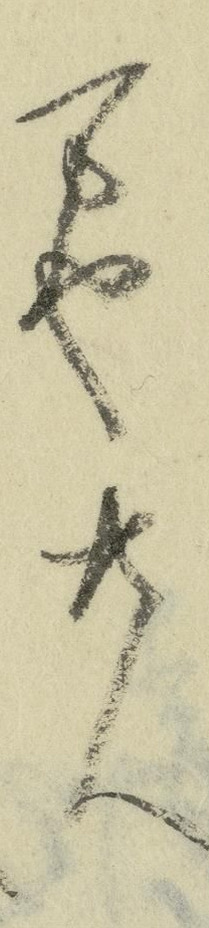万や廿人
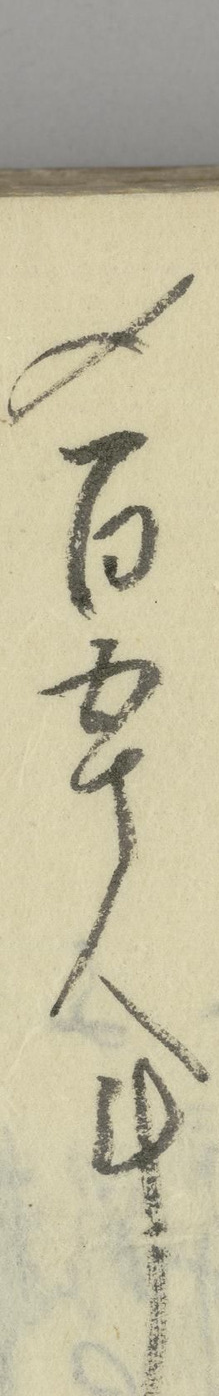〆百五十人計

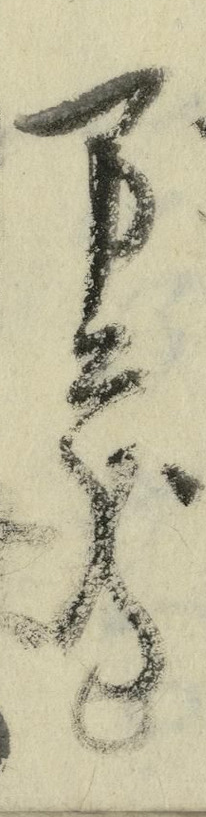伊兵衛
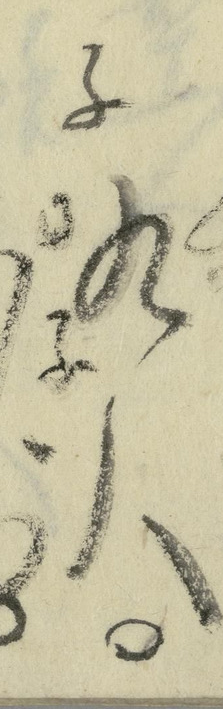子九八
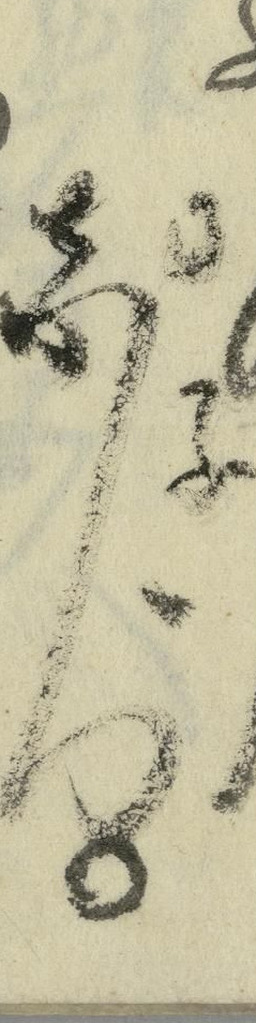嘉右衛門
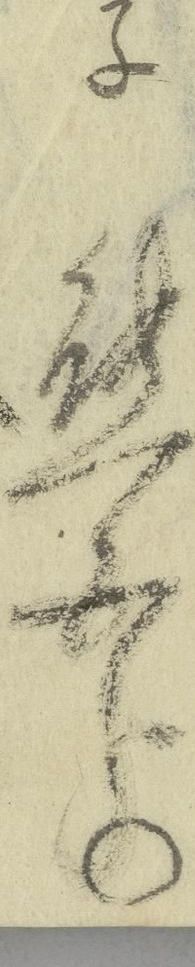子熊五郎
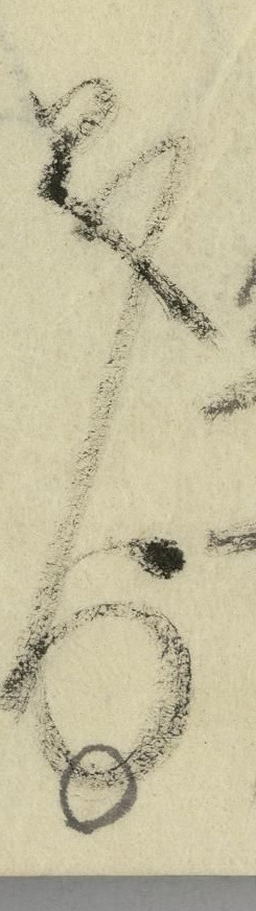嘉右衛門
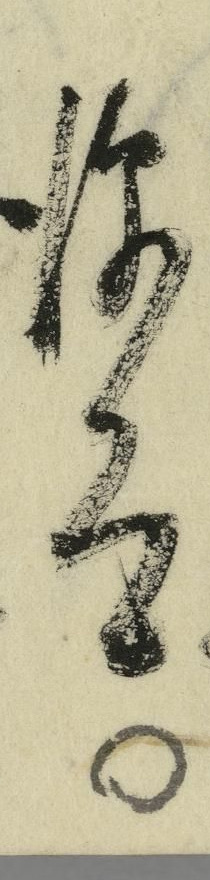伊兵衛
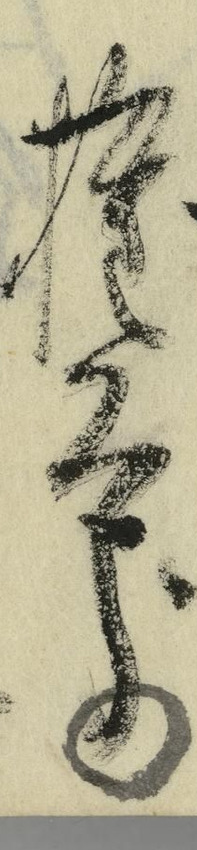権太郎
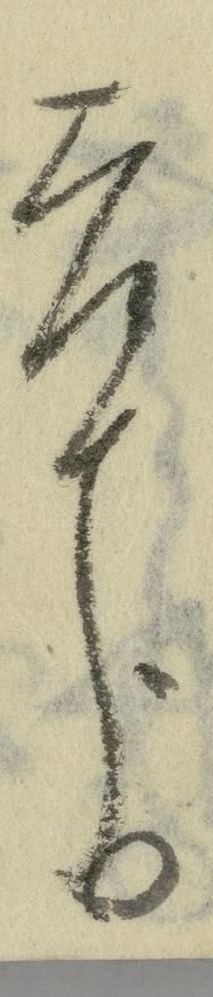嘉右衛門

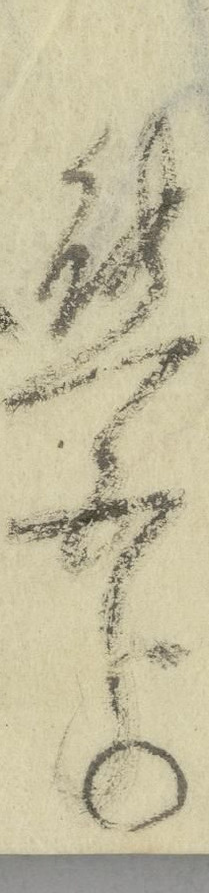政五郎
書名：天明淺間噴火ニ関スル書類
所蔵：東京大学地震研究所図書室 Earthquake Research Institute Library, The University of Tokyo, JAPAN
